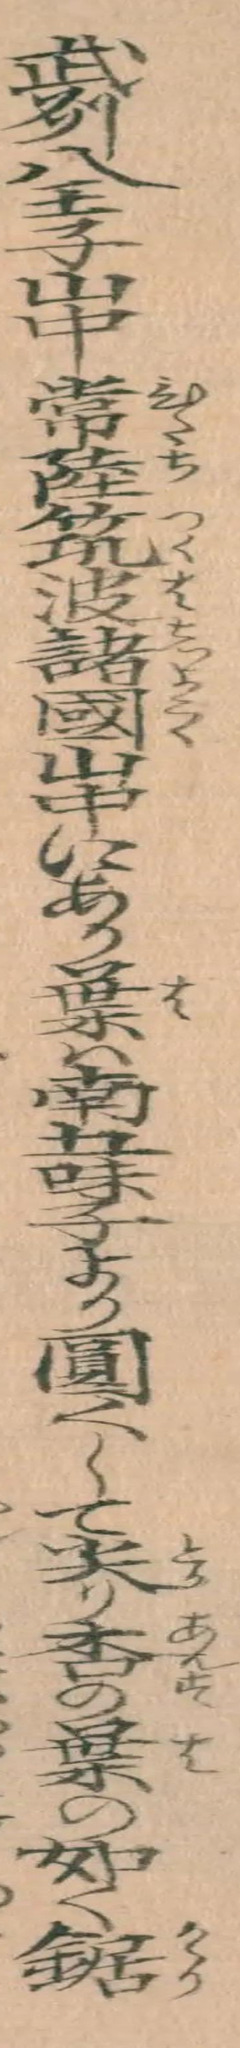武州八王子山中常陸筑波諸国山中にあり葉は南五味子より円くして尖り杏の葉の如く鋸
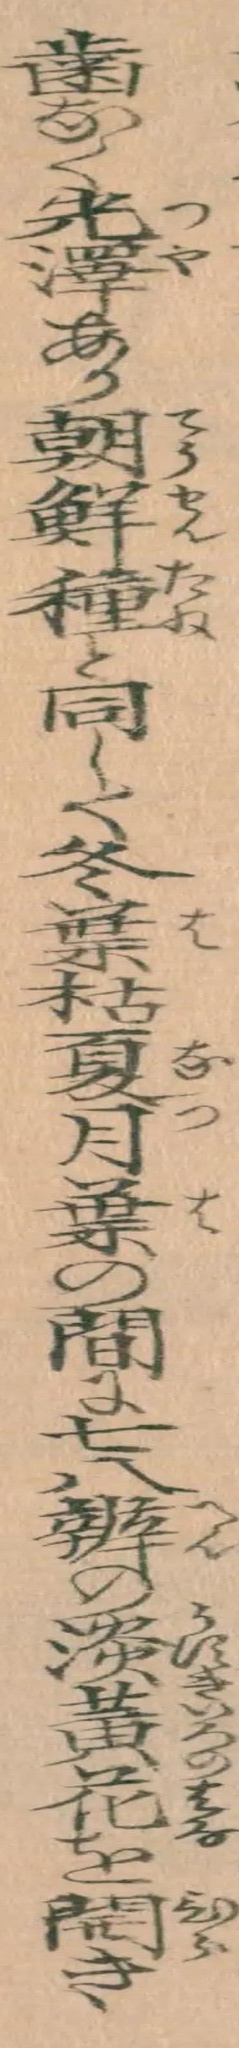歯なく光沢あり朝鮮種と同しく冬葉枯夏月葉の間に七八弁の淡黄花を開き
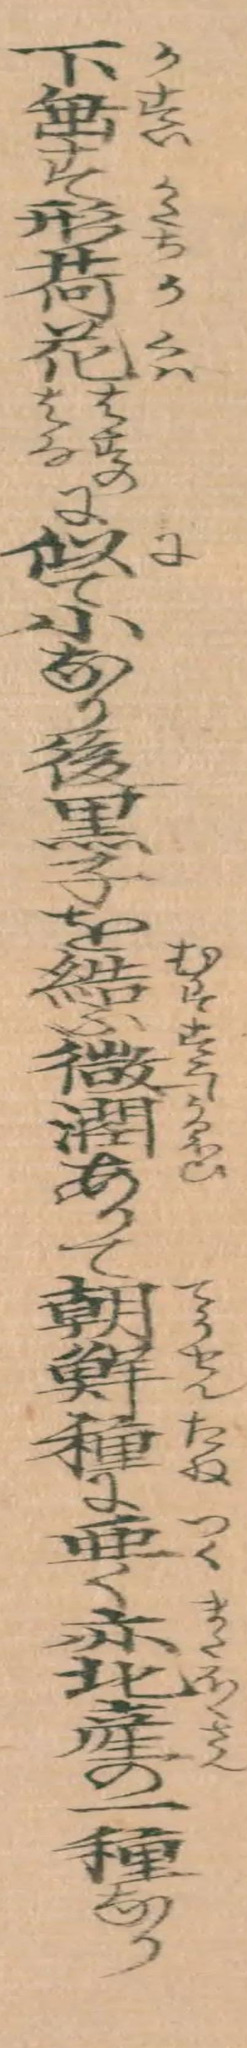下垂す形荷花はすのはなに似て小なり後黒子を結ふ微潤ありて朝鮮種に亜く亦北産の一種なり
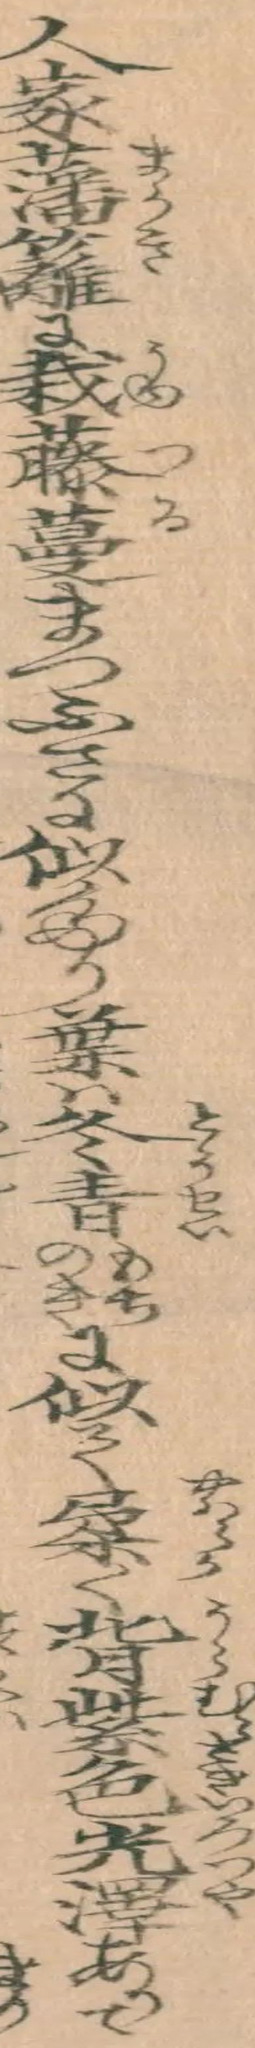人家藩籬に栽藤蔓まつふさに似たり葉は冬青もちのきに似て柔く背紫色光沢ありて
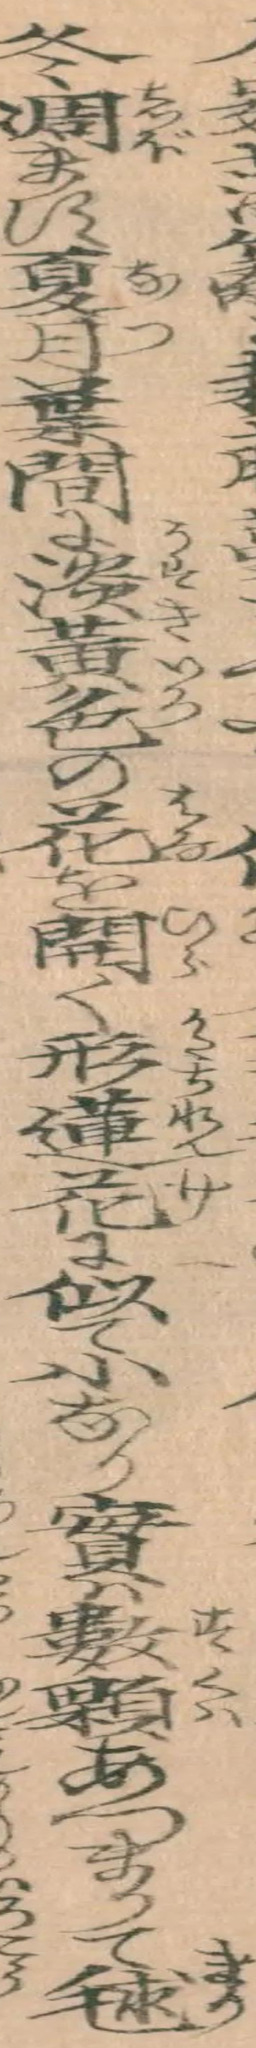冬凋ます夏月葉間に淡黄色の花を開く形蓮花に似て小なり実は数顆あつまりて毬
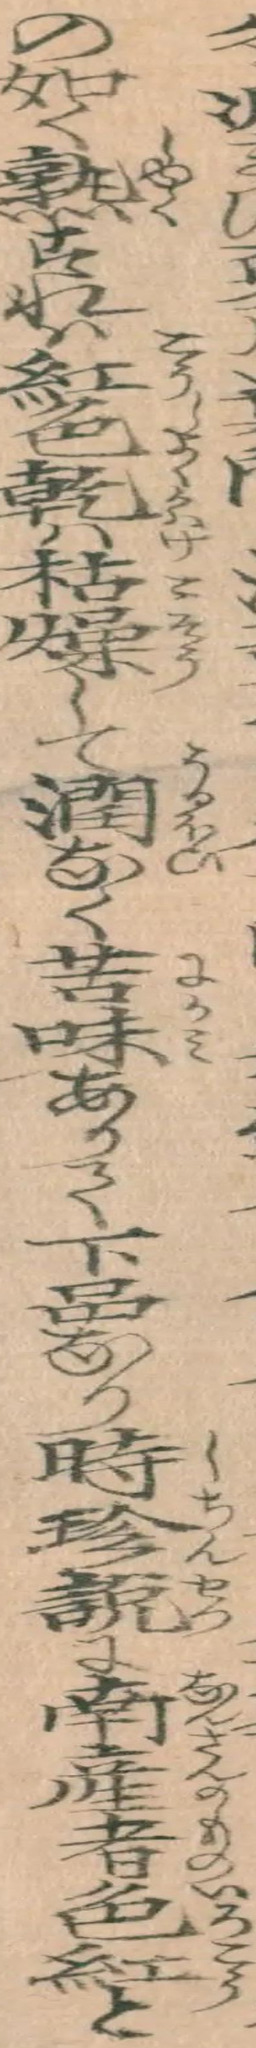の如く熟すれは紅色乾は枯燥して潤なく苦味ありて下品なり時珍説に南産者色紅と
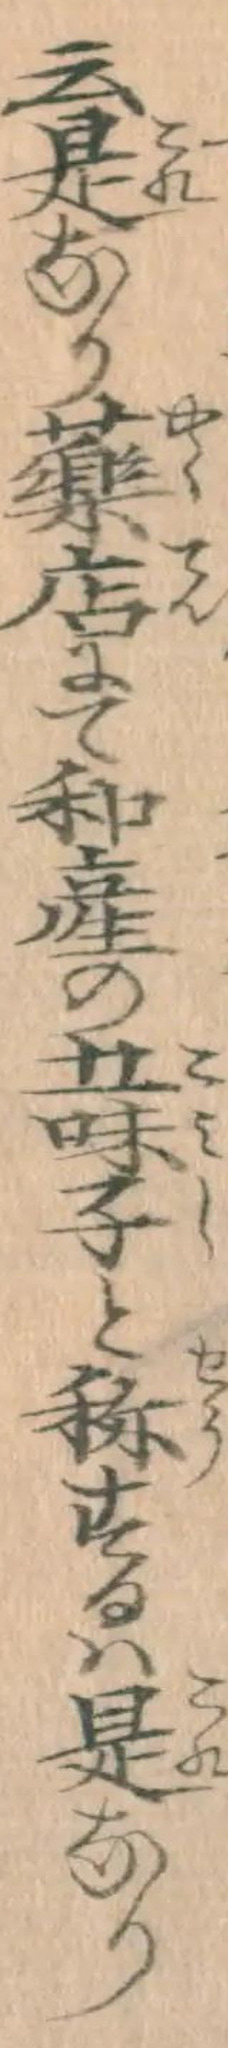云是なり薬店にて和産の五味子と称するは是なり

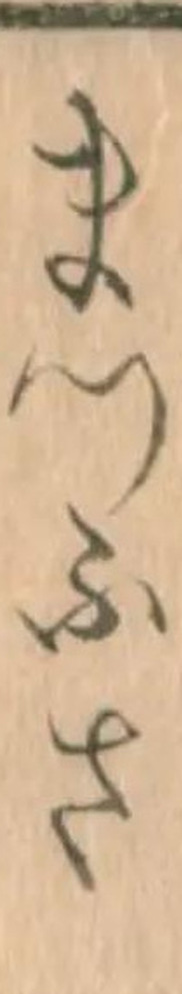まつふさ
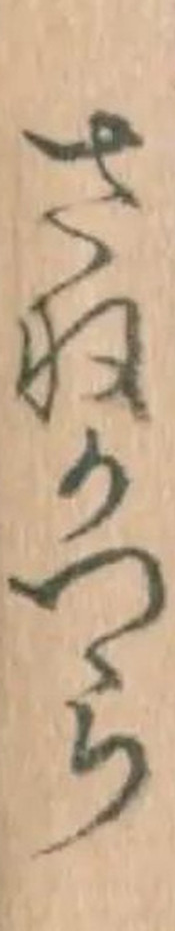さねかつら

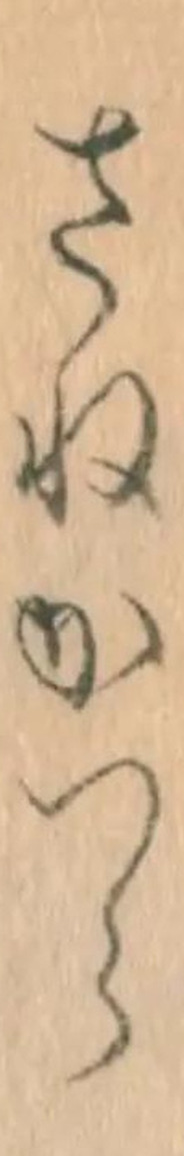さねかつら

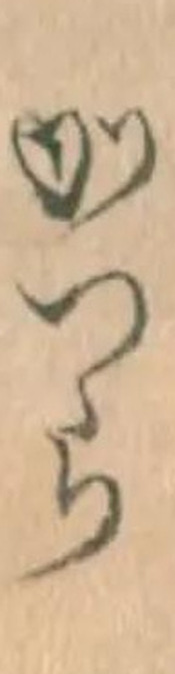かつら
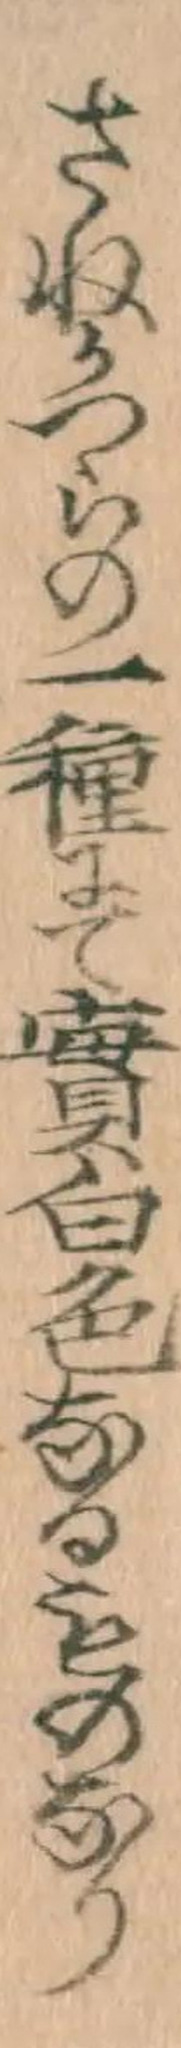さねかつらの一種にて実白色なるものなり
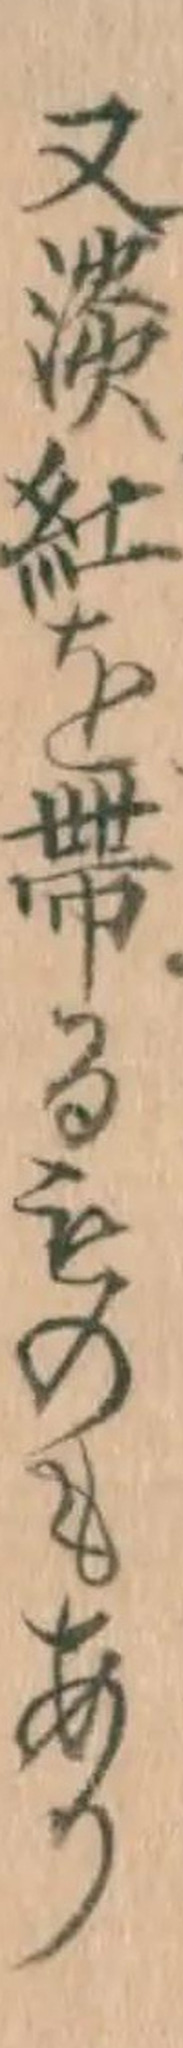又淡紅を帯るものもあり
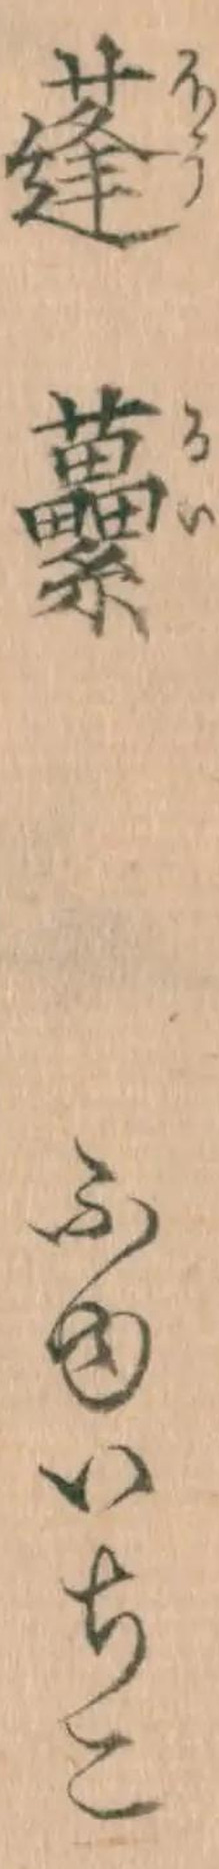蓬虆ふゆいちこ
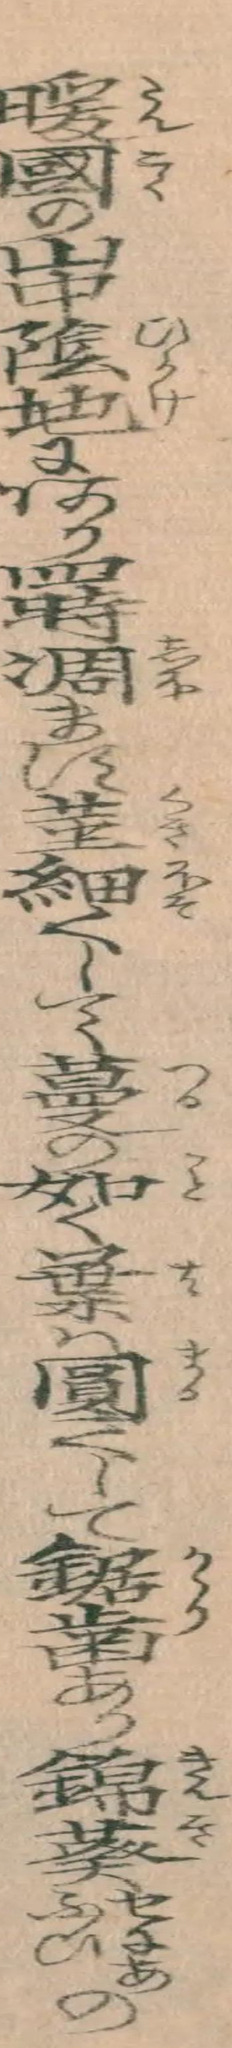暖国の山中陰地にあり四時凋ます茎細くして蔓の如く葉は円くして鋸歯あり錦葵せにあふひの
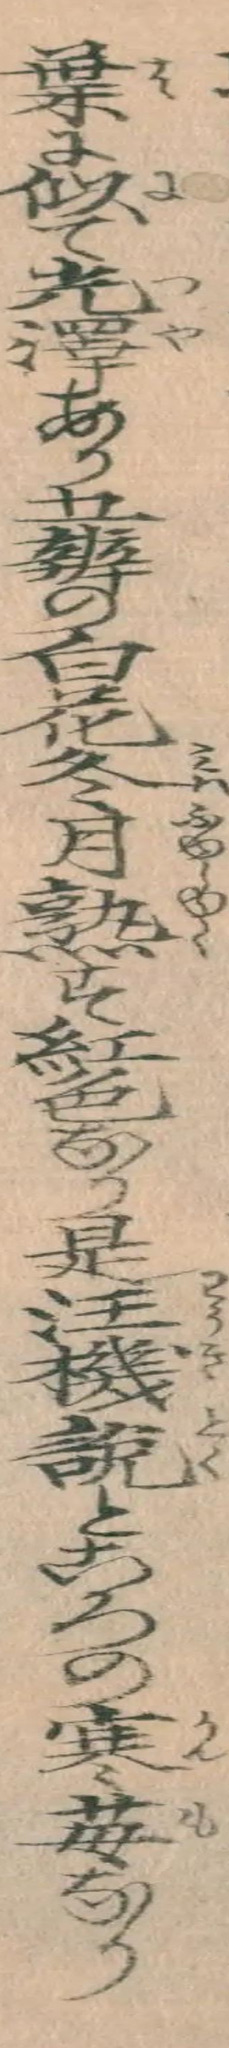葉に似て光沢あり五弁の白花冬月熟す紅色なり是汪機説ところの寒苺なり
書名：本草図譜. 巻25-27
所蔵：国立国会図書館 National Diet Library, JAPAN
